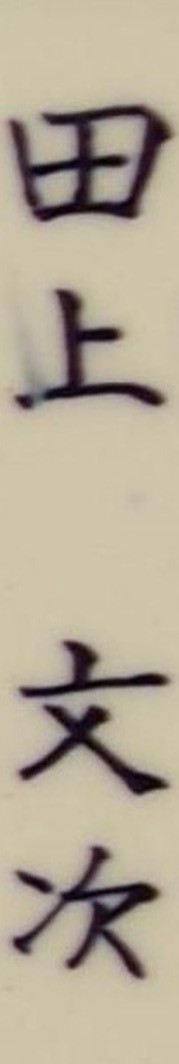田上文次
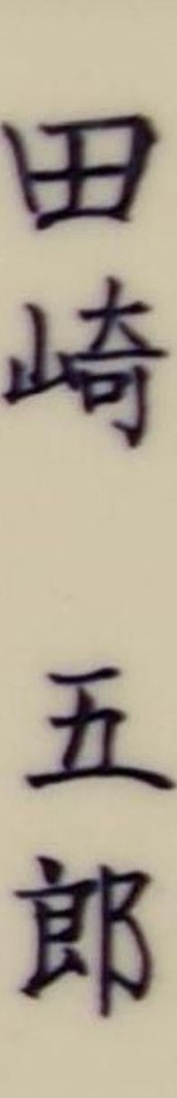田崎五郎
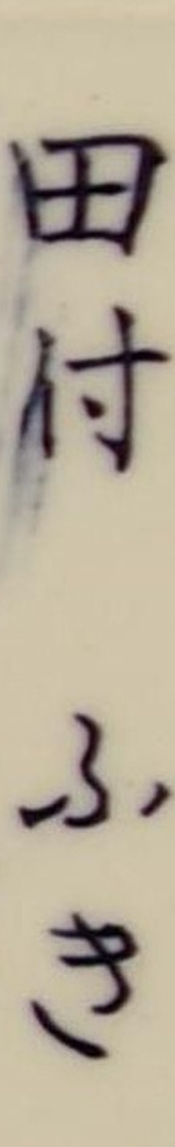田村ふき
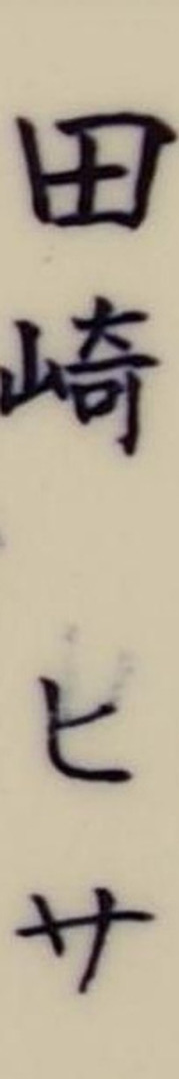田崎ヒサ
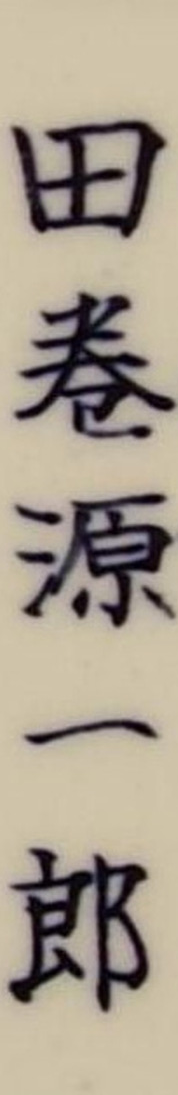田巻源一郎
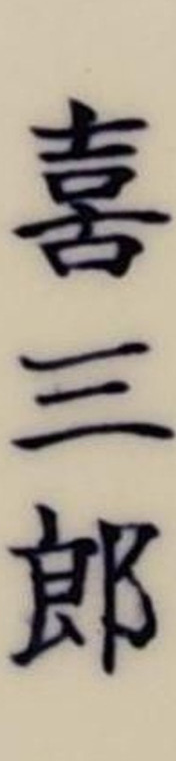喜三郎
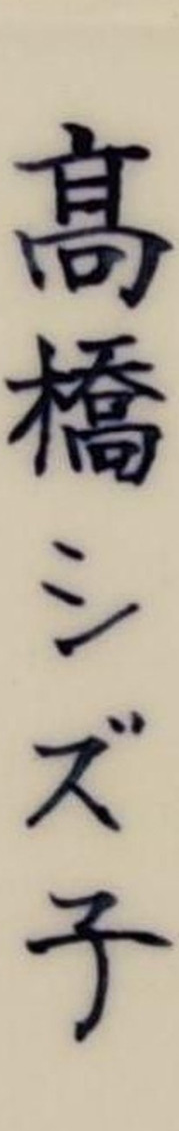高橋シズ子
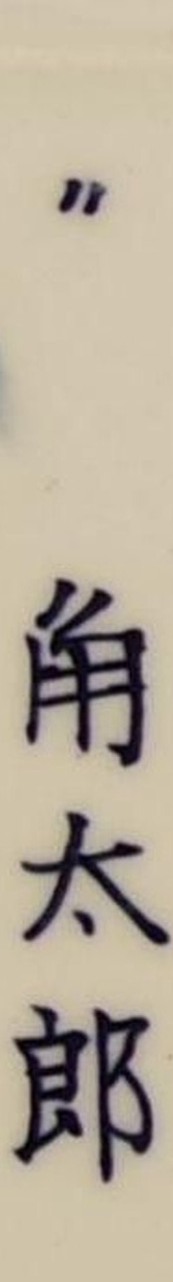角太郎
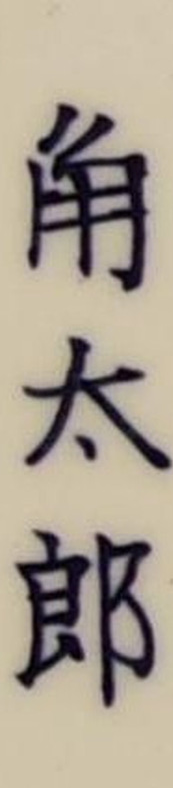角太郎
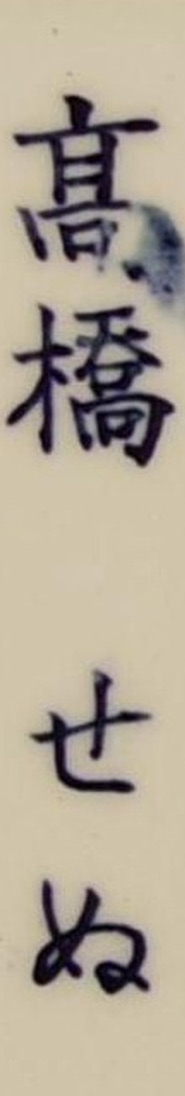高橋せぬ
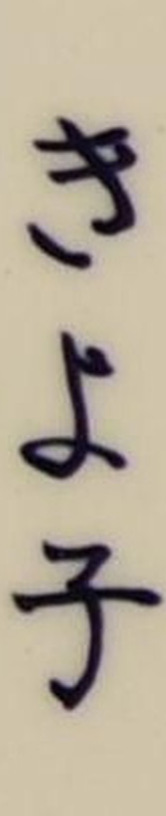きよ子
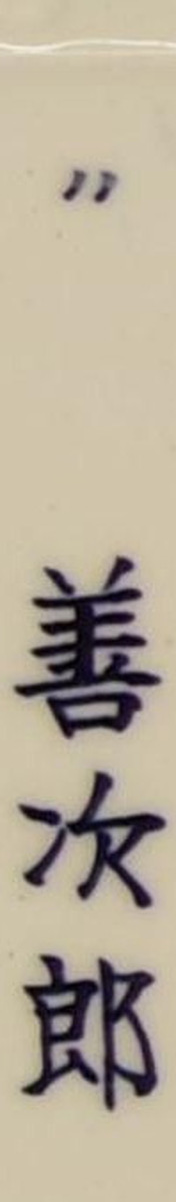善次郎
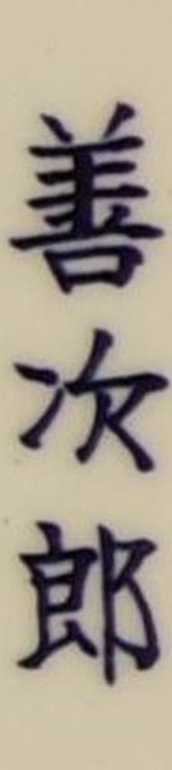善次郎
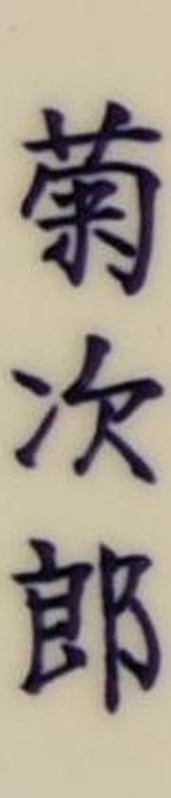菊次郎

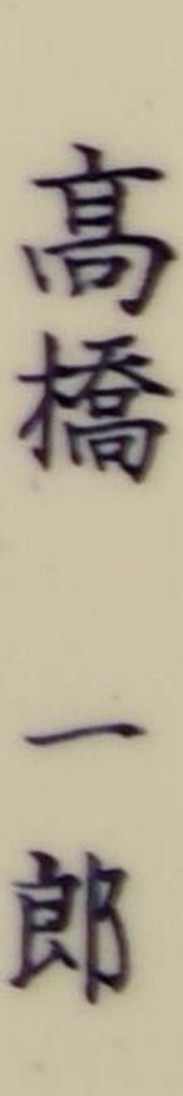高橋一郎
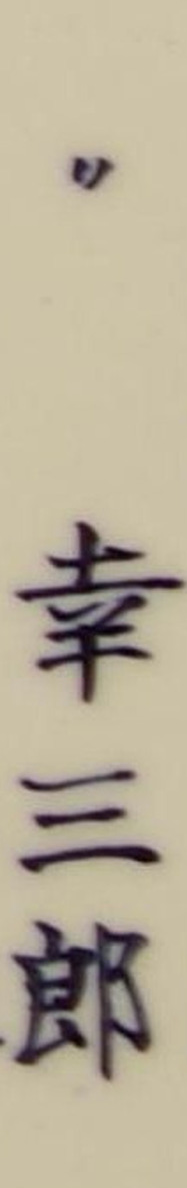幸三郎
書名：A~D
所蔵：koyasan kongobuji
